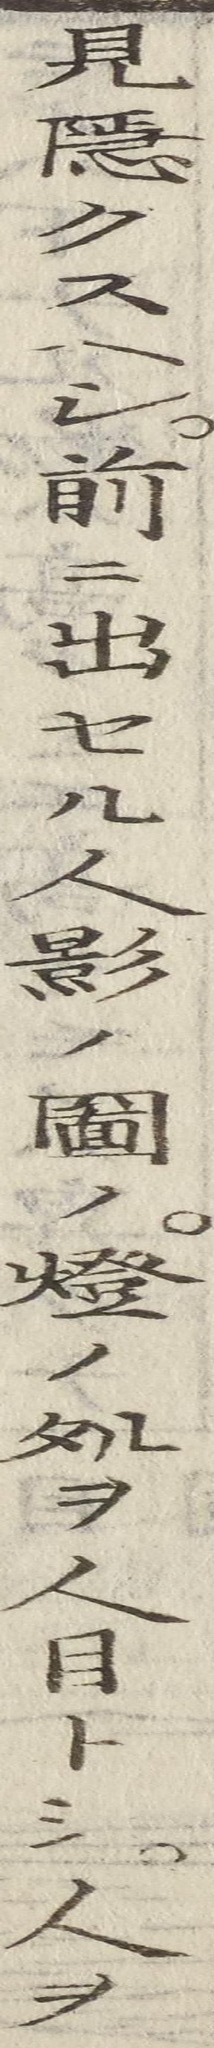見隠クスヘシ。前ニ出セル人影ノ図ノ。燈ノ処ヲ人目トシ。人ヲ
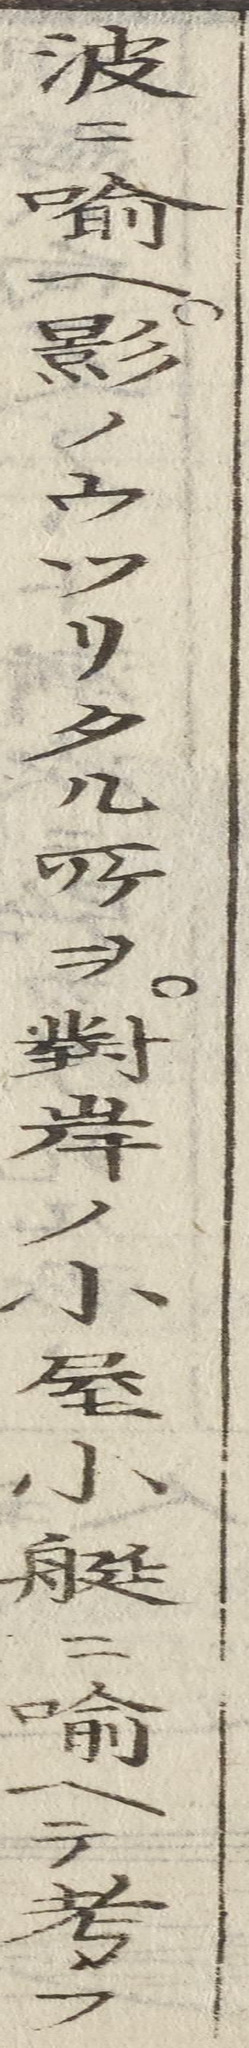波ニ喩ヘ。影ノウツリタル所ヲ。対岸ノ小屋小艇ニ喩ヘテ考フ
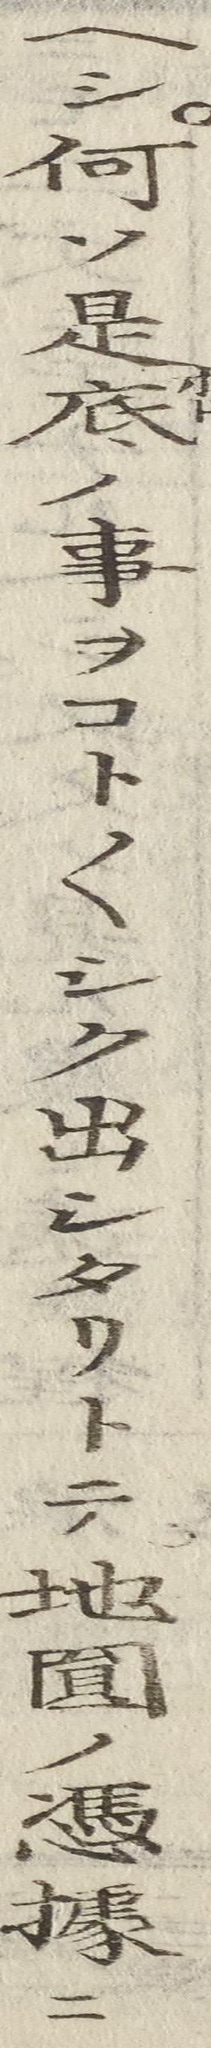ヘシ。何ソ是底ノ事ヲコト〳〵シク出シタリトテ地円ノ憑拠ニ
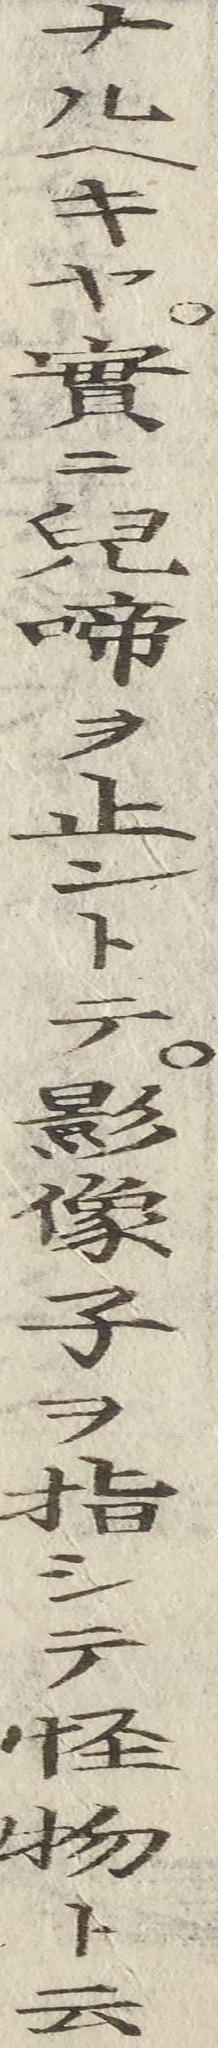ナルヘキヤ。実ニ兒啼ヲ止ントテ。影像子ヲ指シテ怪物ト云
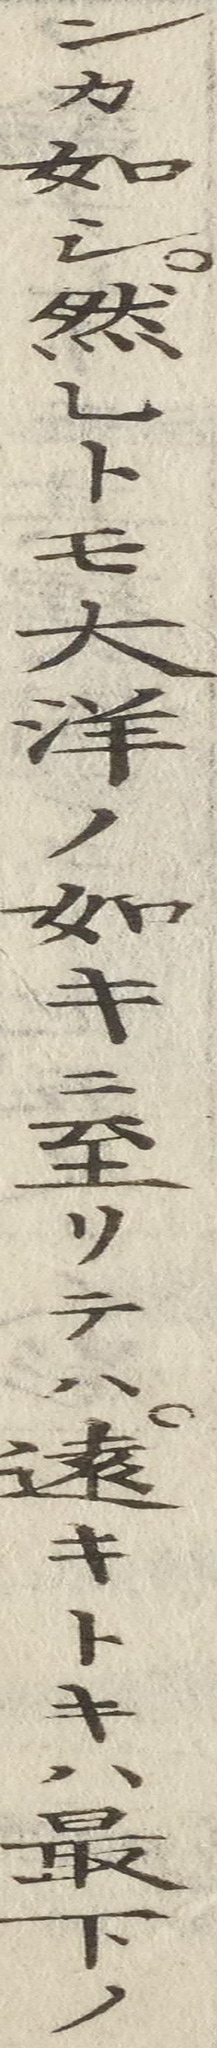ンカ如シ。然レトモ大洋ノ如キニ至リテハ。遠キトキハ最下ノ
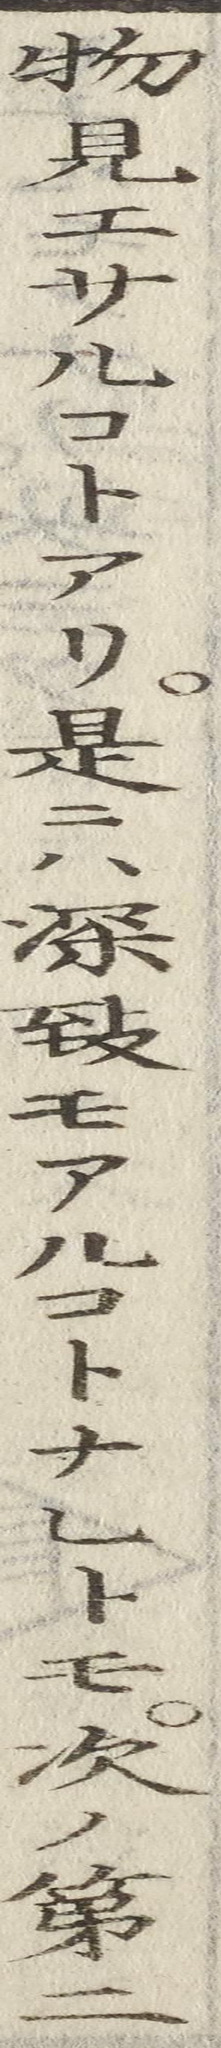物見エサルコトアリ。是ニハ深致モアルコトナレトモ。次ノ第二
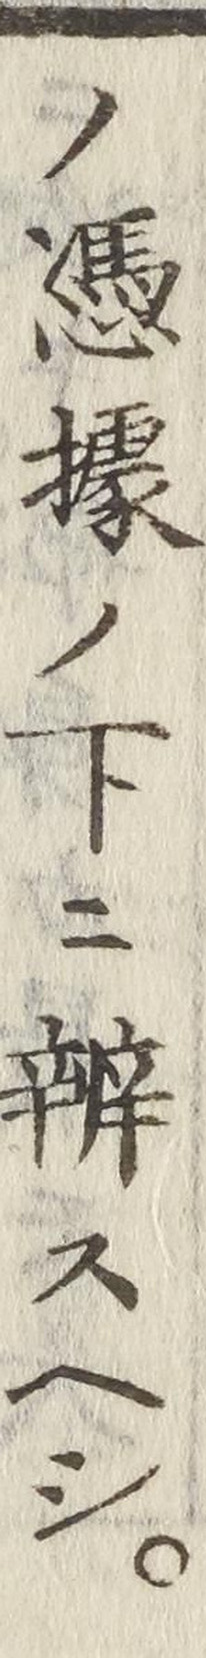ノ憑拠ノ下ニ弁スヘシ。
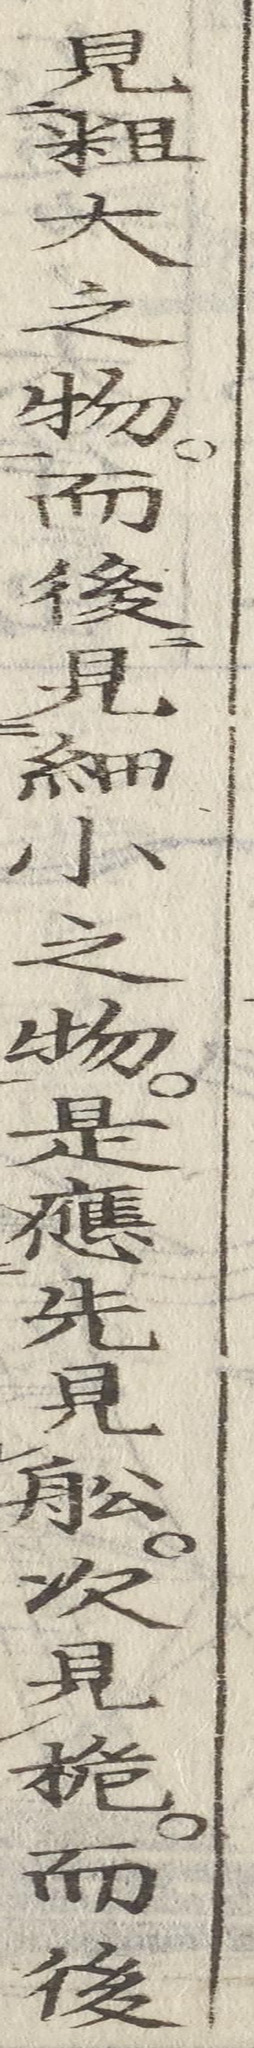見粗大之物。而後二見細小之物。是応先見舩。次見桅。而後

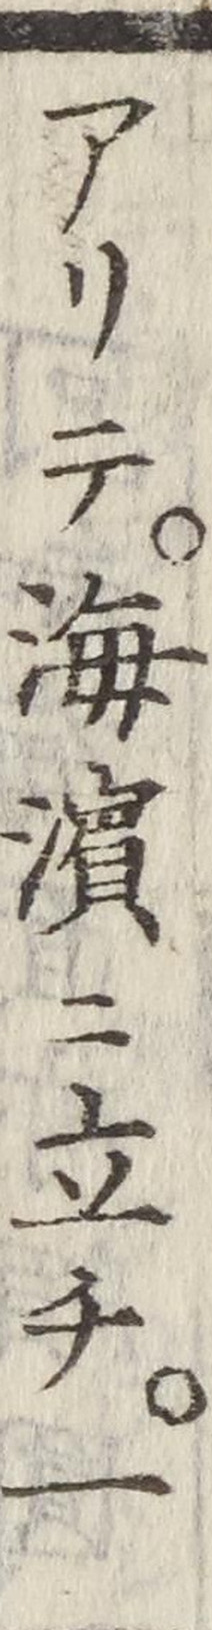アリテ。海浜ニ立チ。一
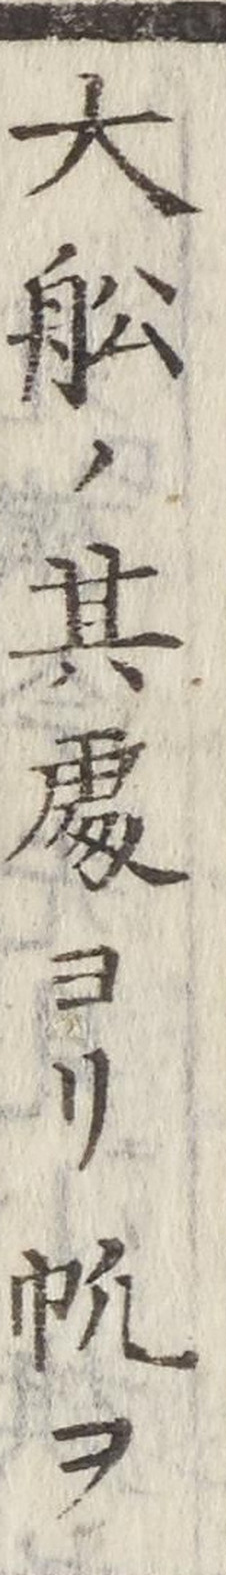大舩ノ其処ヨリ帆ヲ
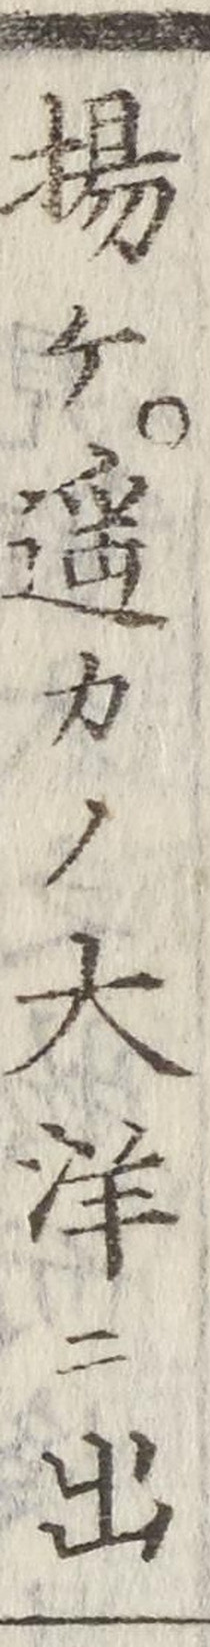揚ゲ。遥カノ大洋ニ出
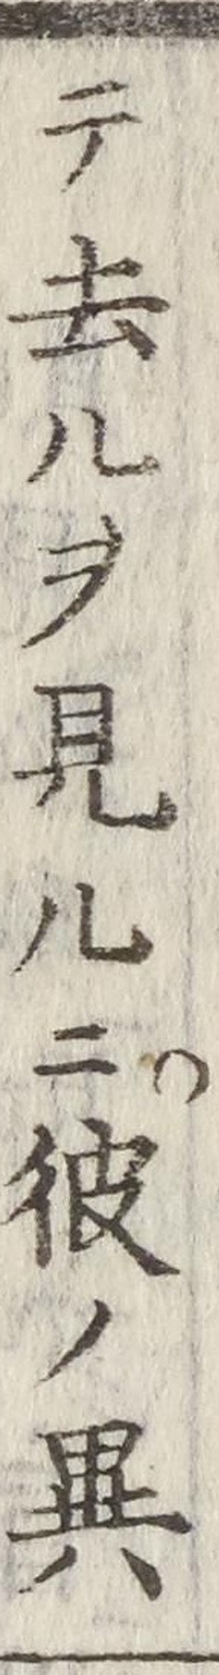テ去ルヲ見ルニ。彼ノ異
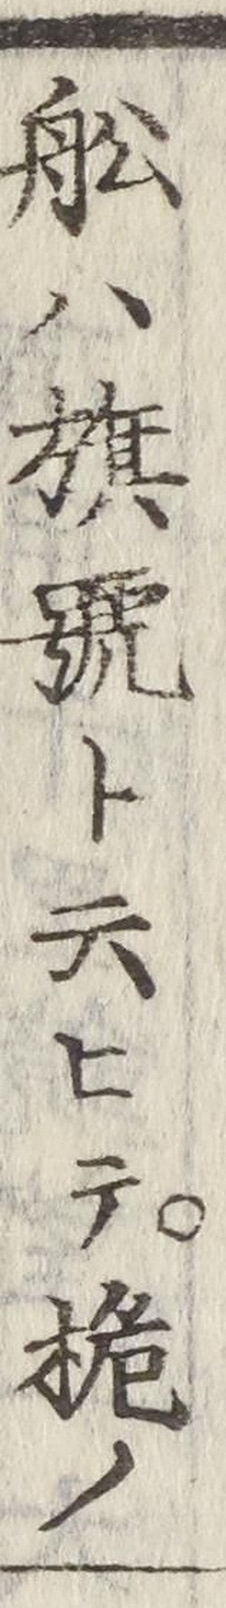舩ハ旗号ト云ヒテ。桅ノ
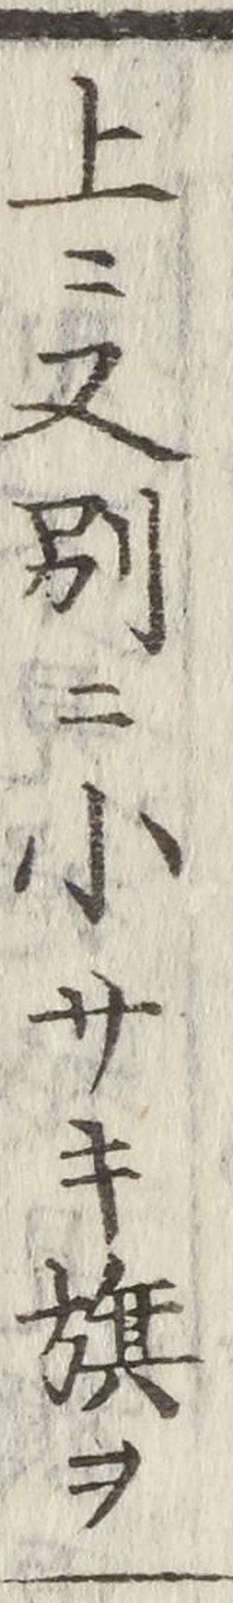上ニ又別ニ小サキ旗ヲ
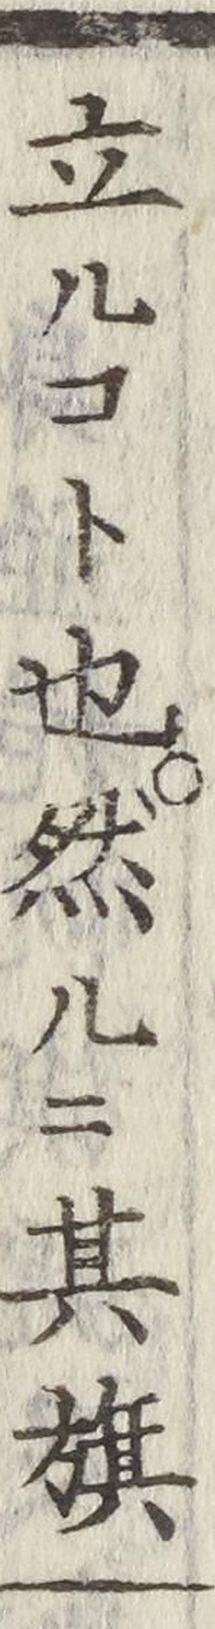立ルコト也。然ルニ其旗
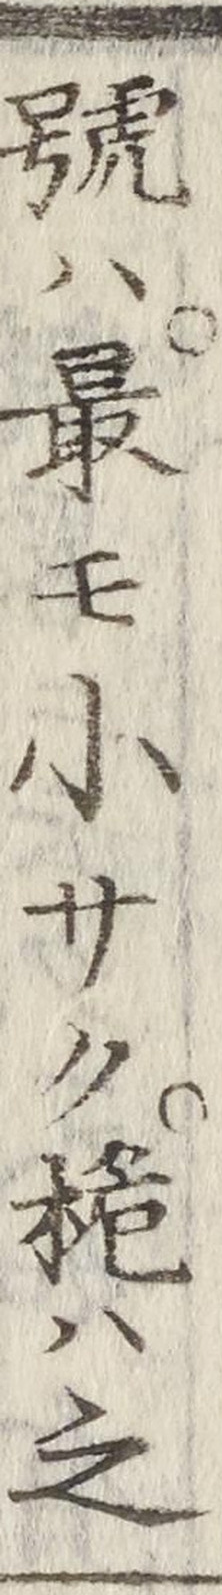号ハ。最モ小サク。桅ハ之
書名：護法新論　中
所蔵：東京大学地震研究所図書室 Earthquake Research Institute Library, The University of Tokyo, JAPAN
